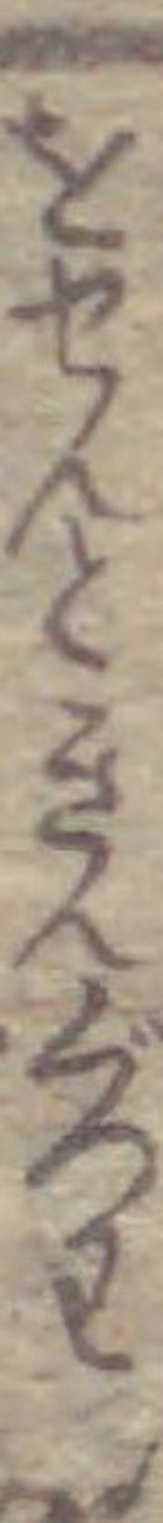をせんときんぐつわ
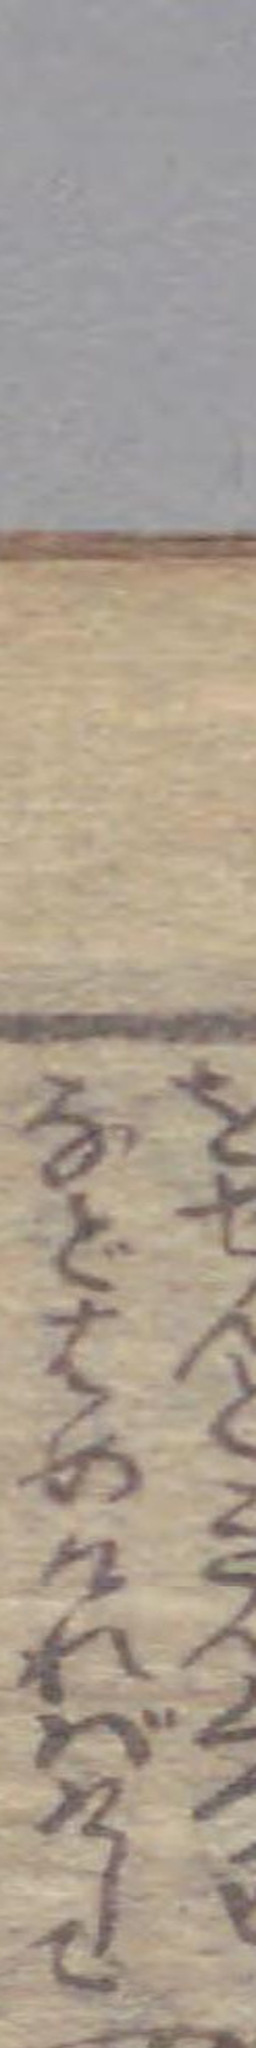などはめければけして
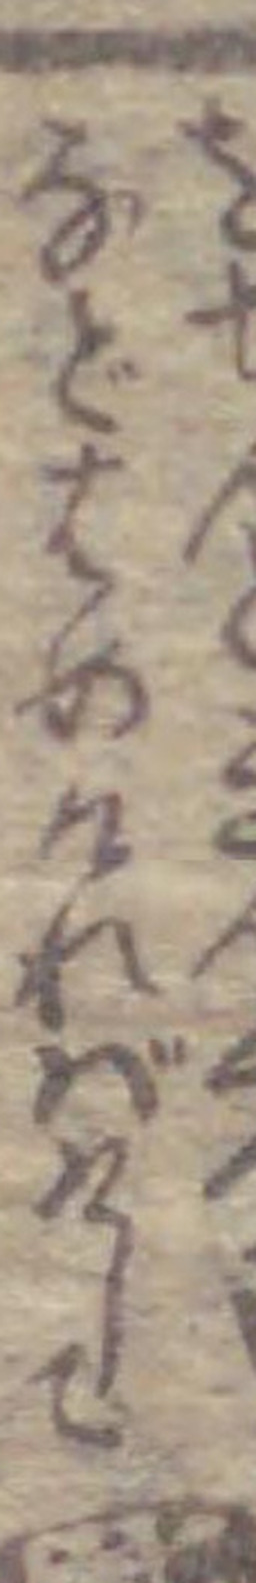などはめければけして
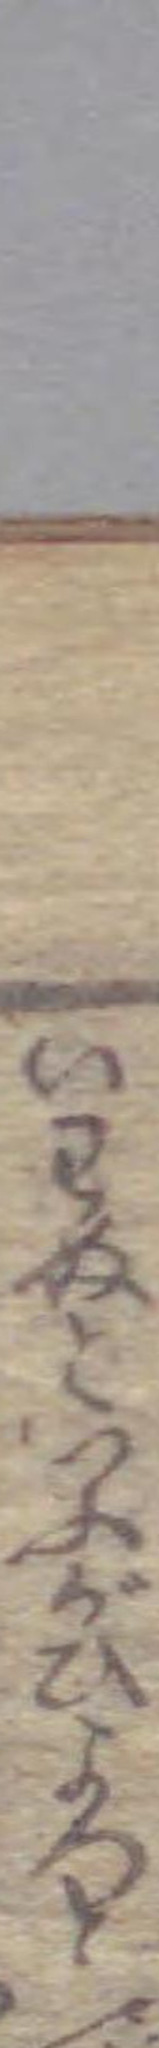いわぬといふがひよつと
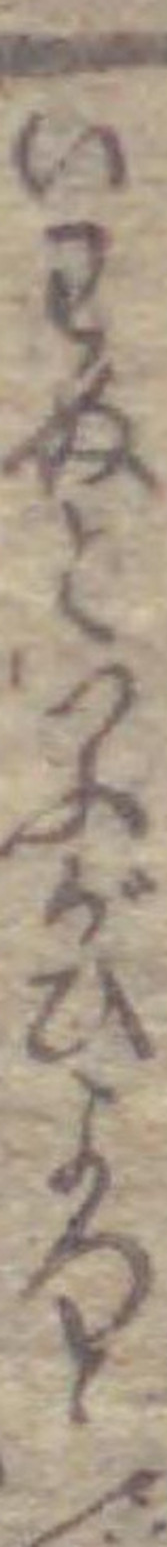いわぬといふがひよつと
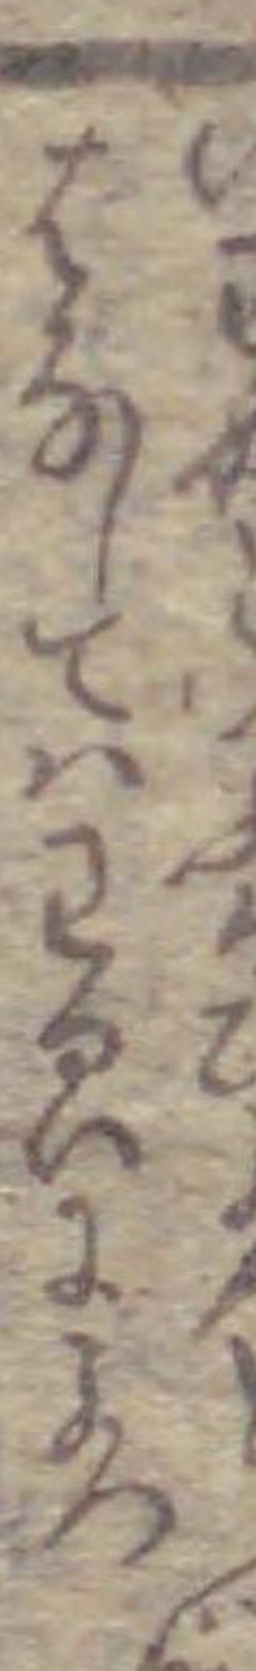はなしてはわるいによつ
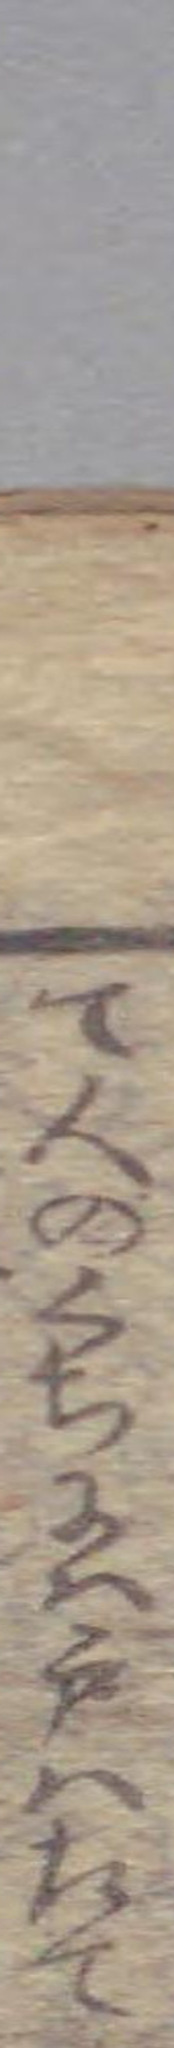て人のくちには戸はたて
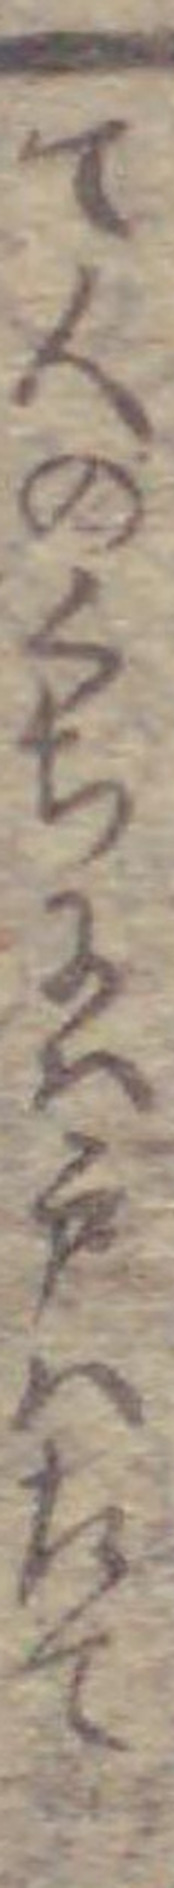て人のくちには戸はたて
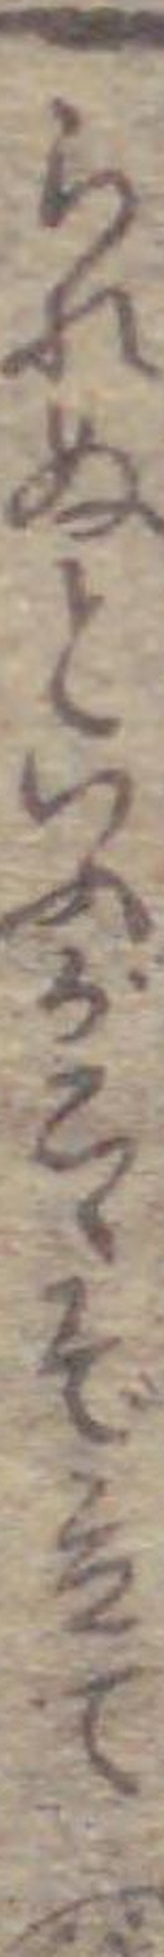られぬといふがここぞ立て
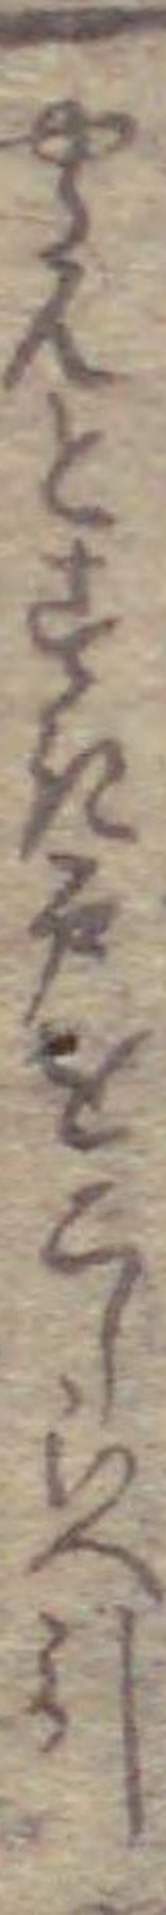やらんとすき戸をこしらへ引
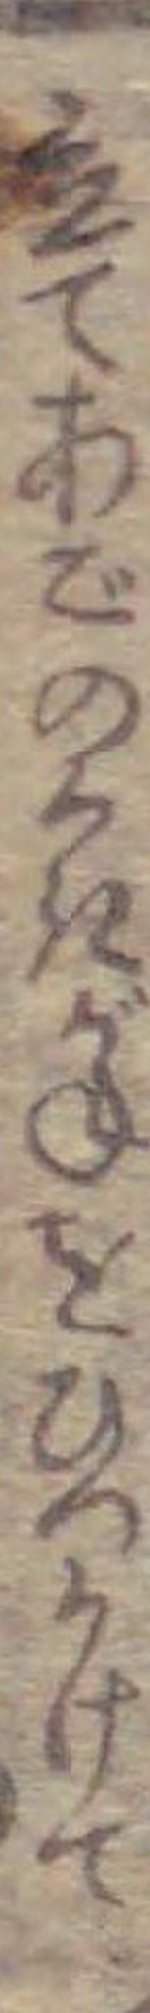立てあごのかきがねをひつかけて

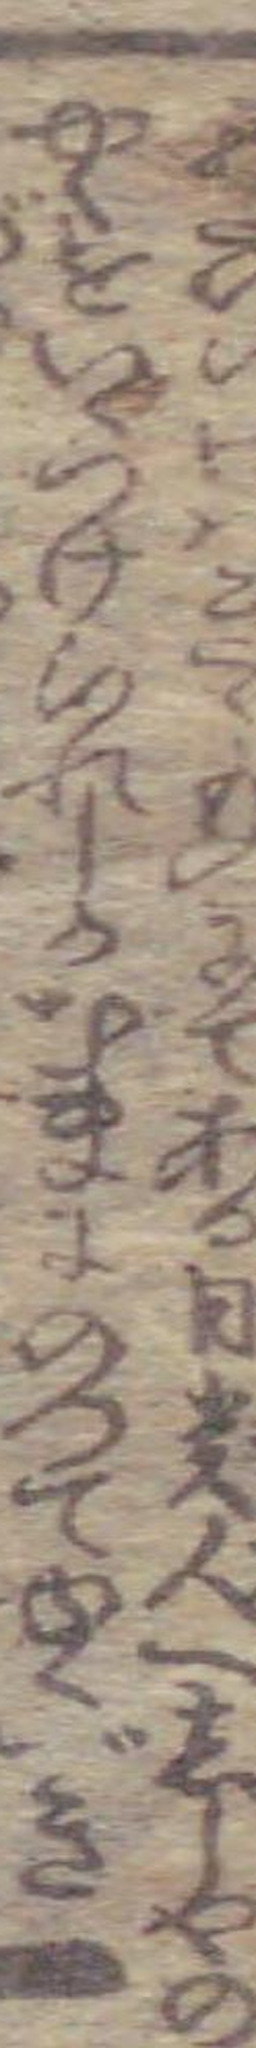やくをいいつけられしかむまにのつてゆくべき
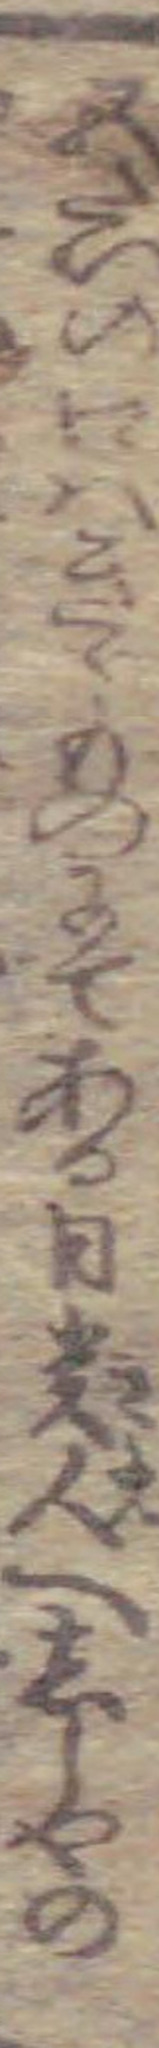五たいの口はきゝものにてある日貴人へししやの
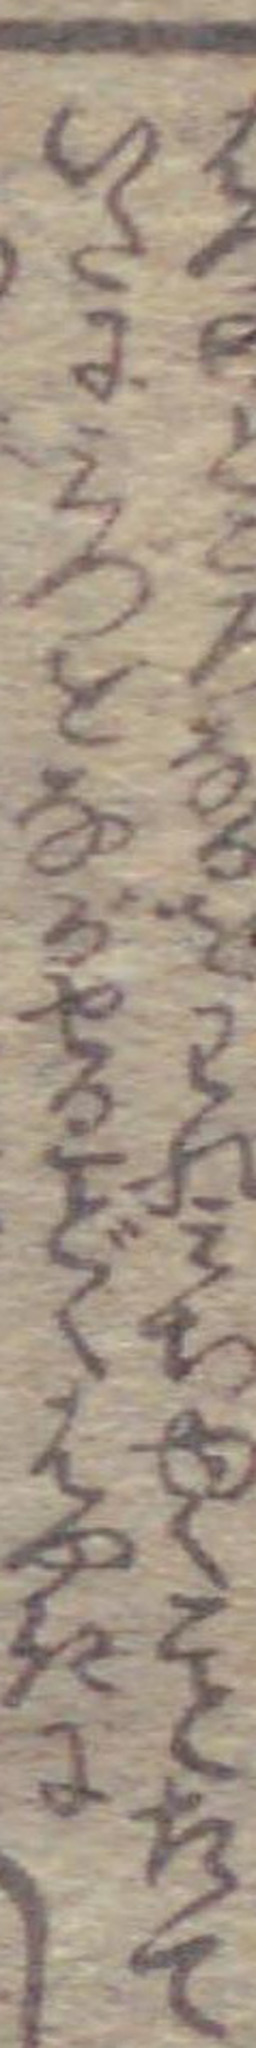いたにみづをながせるごとくはやきに
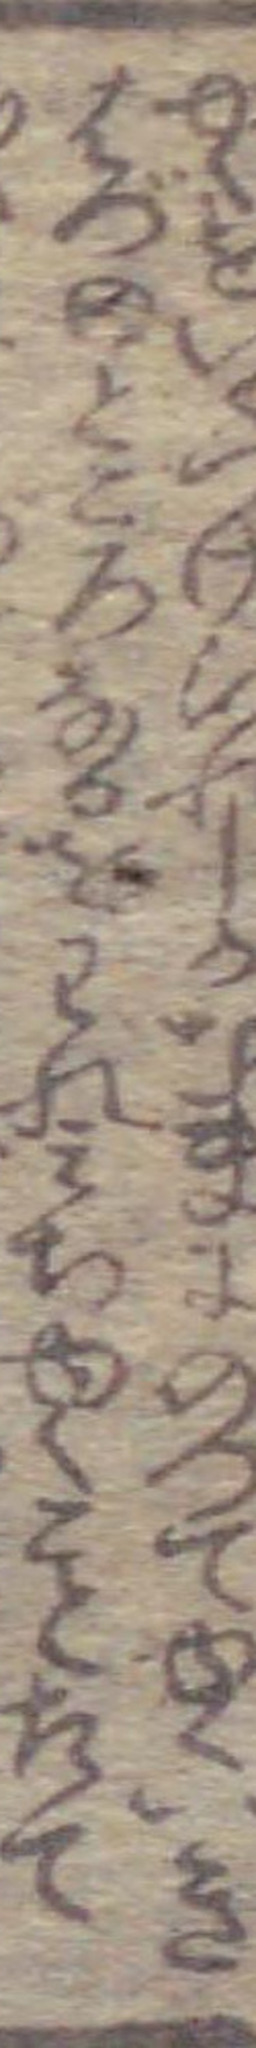はづのところなるをわれみちゆくことたて

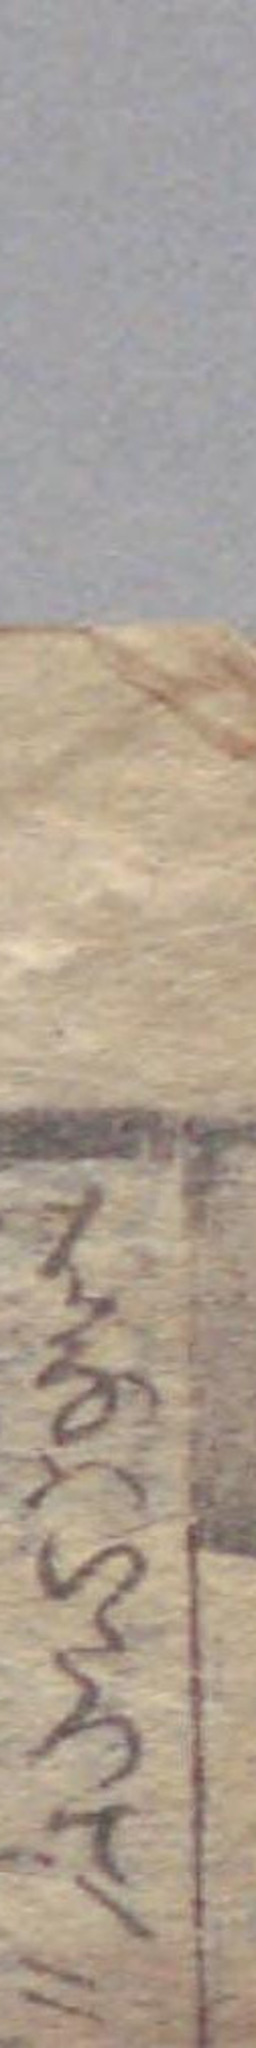はなはいたつて
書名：五躰不具毒解薬 : 3巻
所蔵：国立国会図書館 National Diet Library, JAPAN
